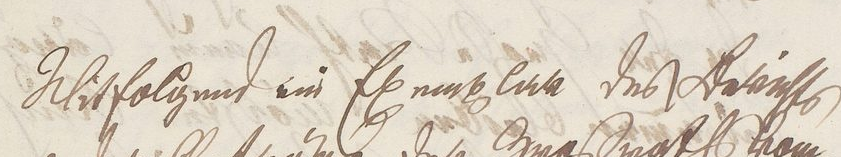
Mitfolgend ein Exemplar des Berichts
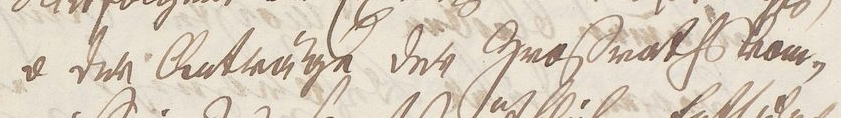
& der Anträge der Großrathskom-
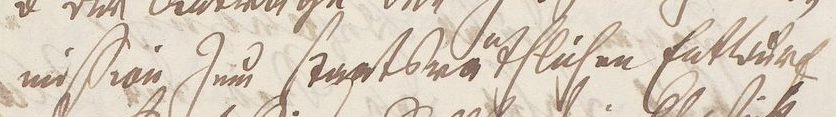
mission zum staatsräthlichen Entwurf
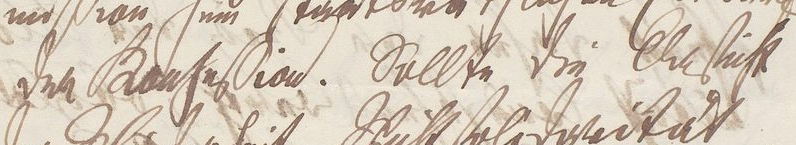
der Konzession. Sollte die Ansicht
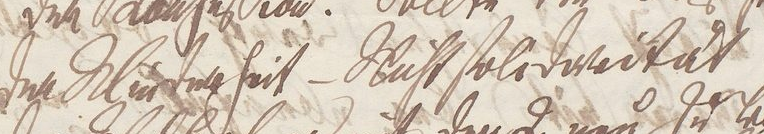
der Minderheit – Nichtsolidarität
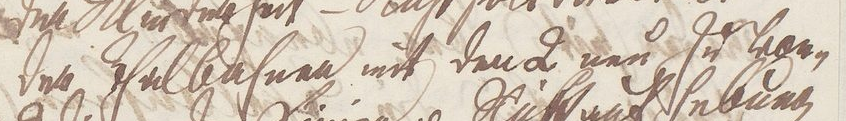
der Thalbahnen mit den 2 neu zu kon-
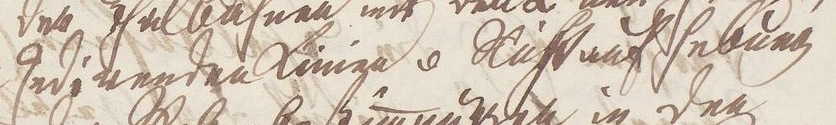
zedirenden Linien & Nichtaufhebung
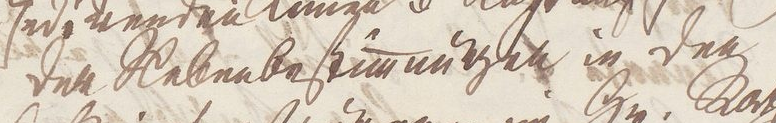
der Nebenbestimmungen in den
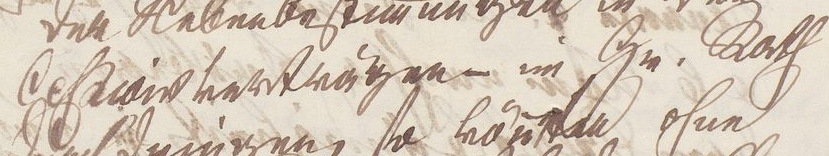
Cessionsverträgen – im Gr. Rath
